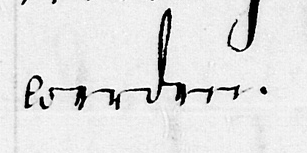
werden.
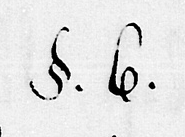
§. 6.
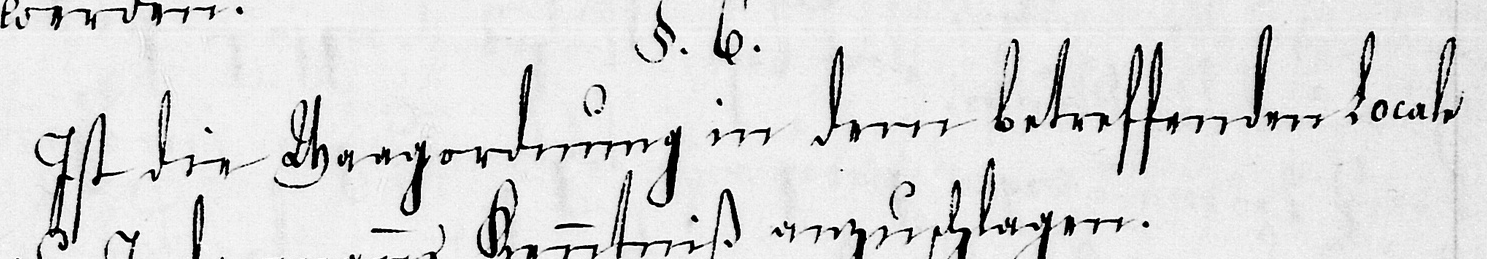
Ist die Waagordnung in dem betreffenden Locale
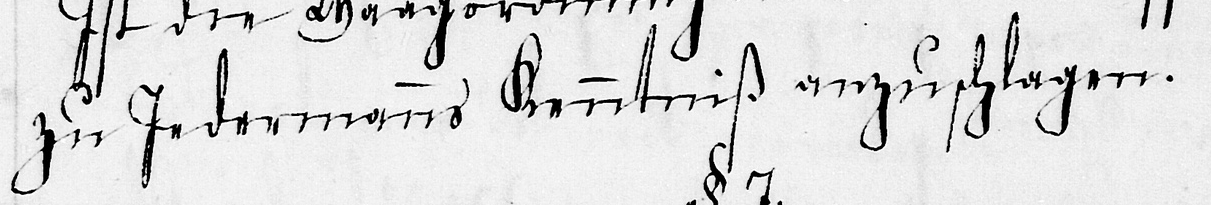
zu Jedermanns Kenntniß anzuschlagen.
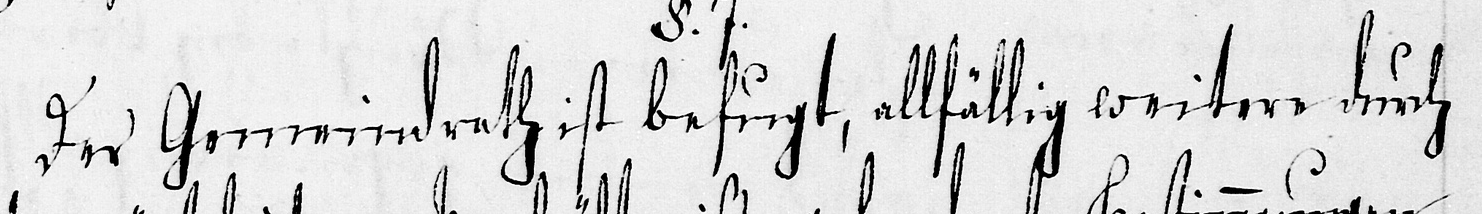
Der Gemeindrath ist befugt, allfällig weitere durch
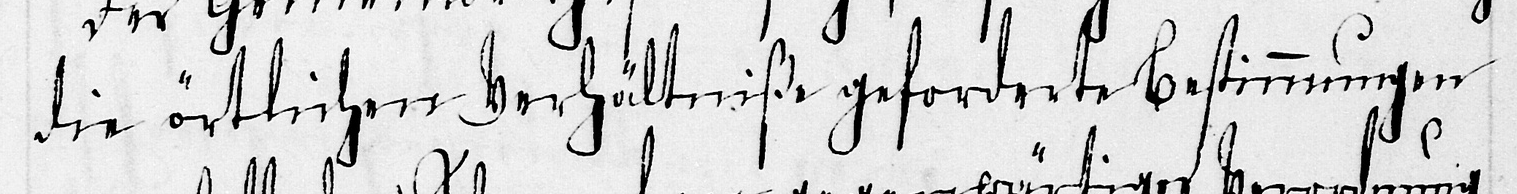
die örtlichen Verhältniße geforderte Bestimmungen
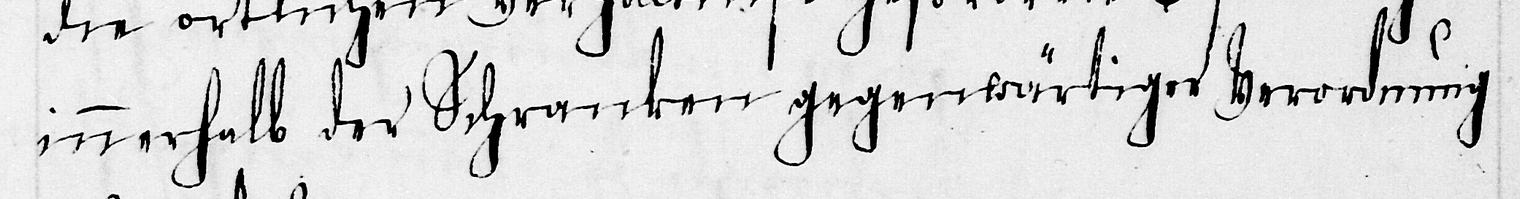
innerhalb der Schranken gegenwärtiger Verordnung
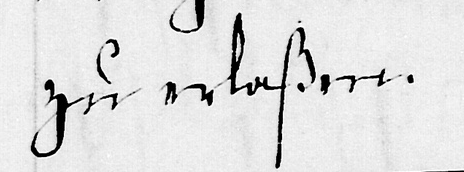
zu erlaßen.
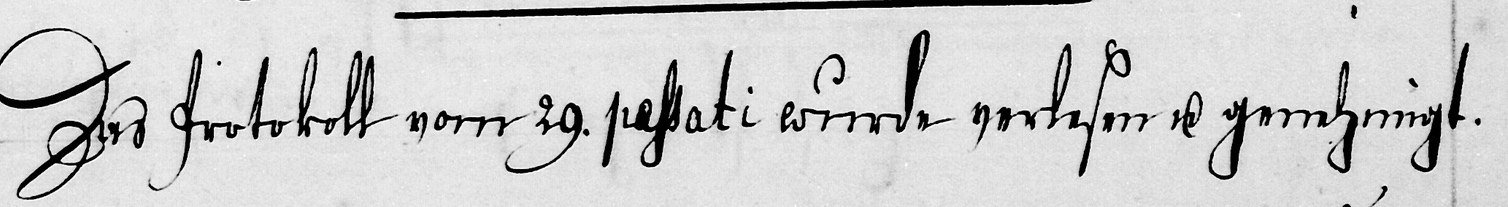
Das Protokoll vom 29. passati wurde verlesen u. genehmigt.
